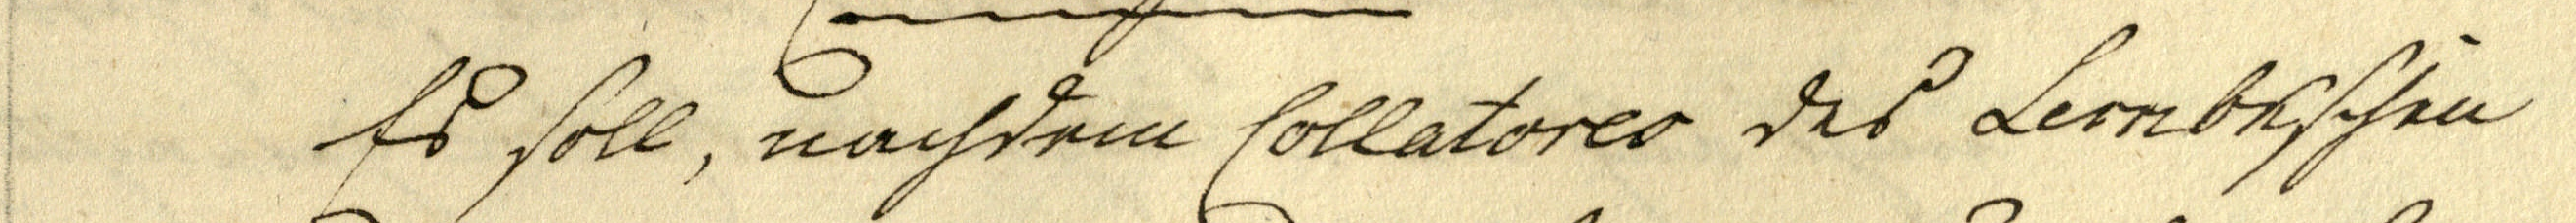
Es soll, nachdem Collatores des Lembkschen
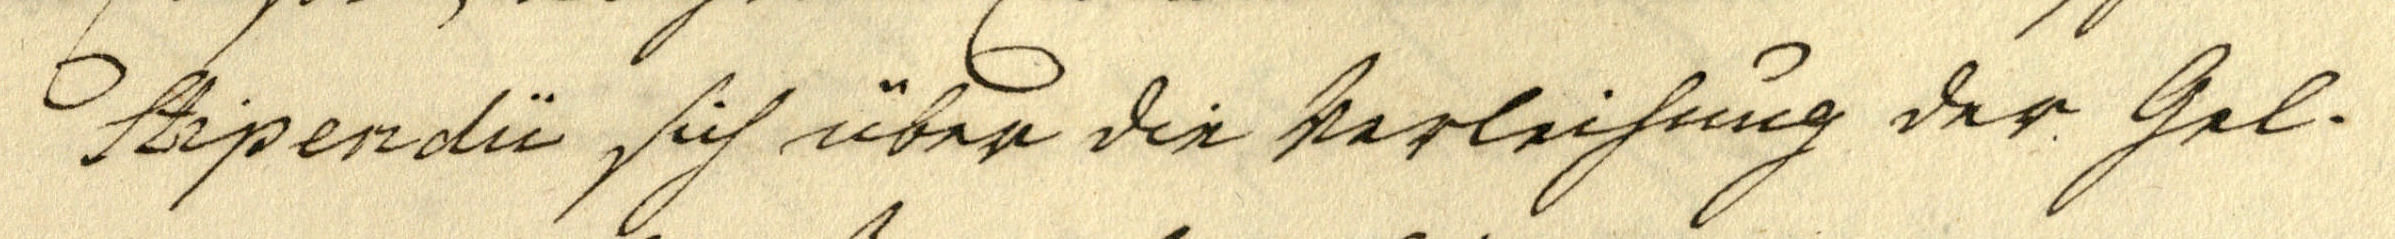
Stipendii sich über die Verleihung der Gel-
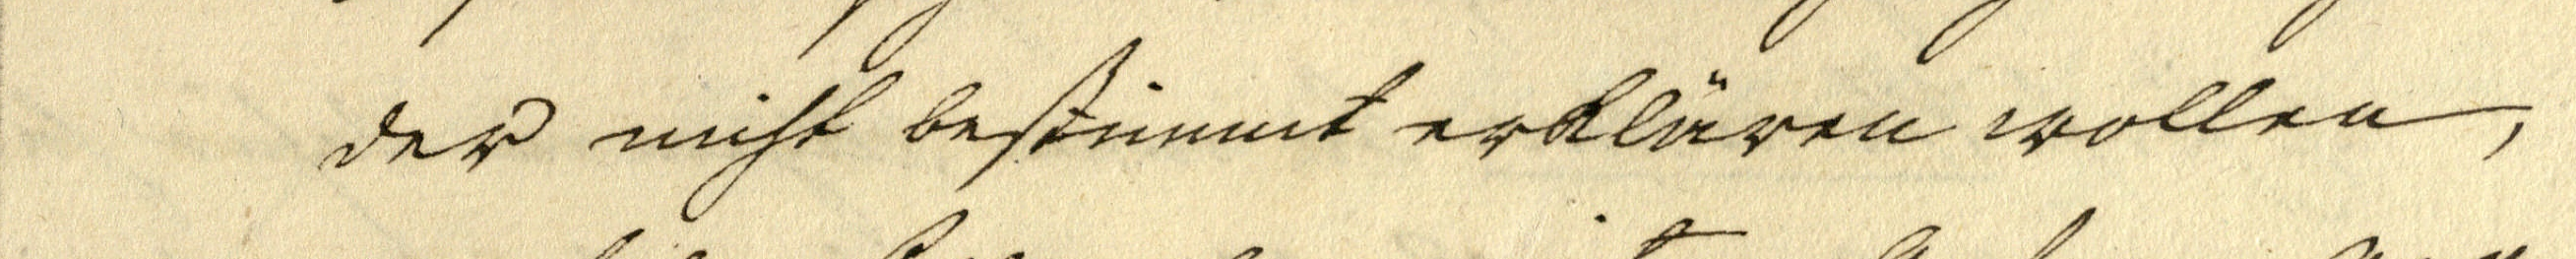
der nicht bestimmt erklären wollen,
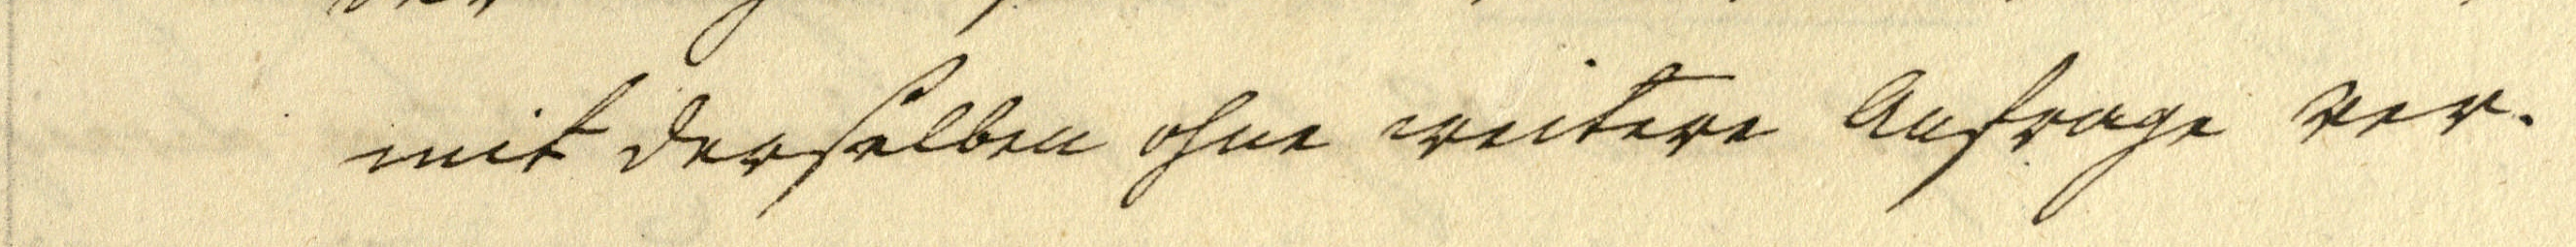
mit derselben ohne weitere Anfrage ver-
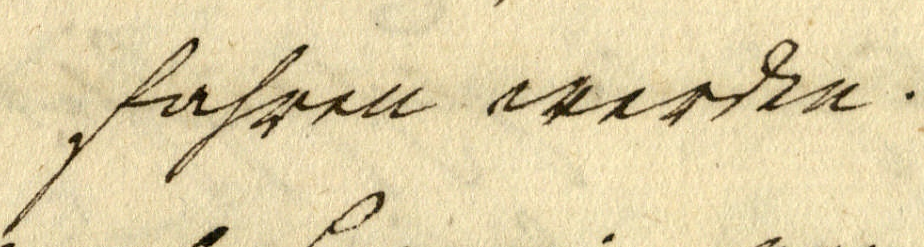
fahren werden.
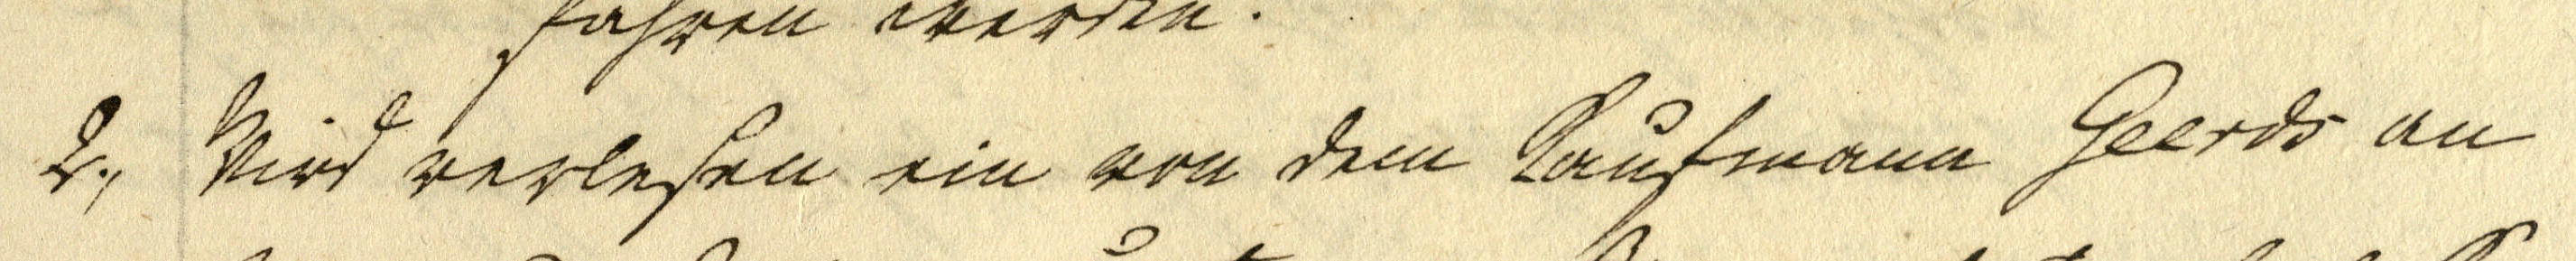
2., Wird verwiesen ein von dem Kaufmann Geerds an
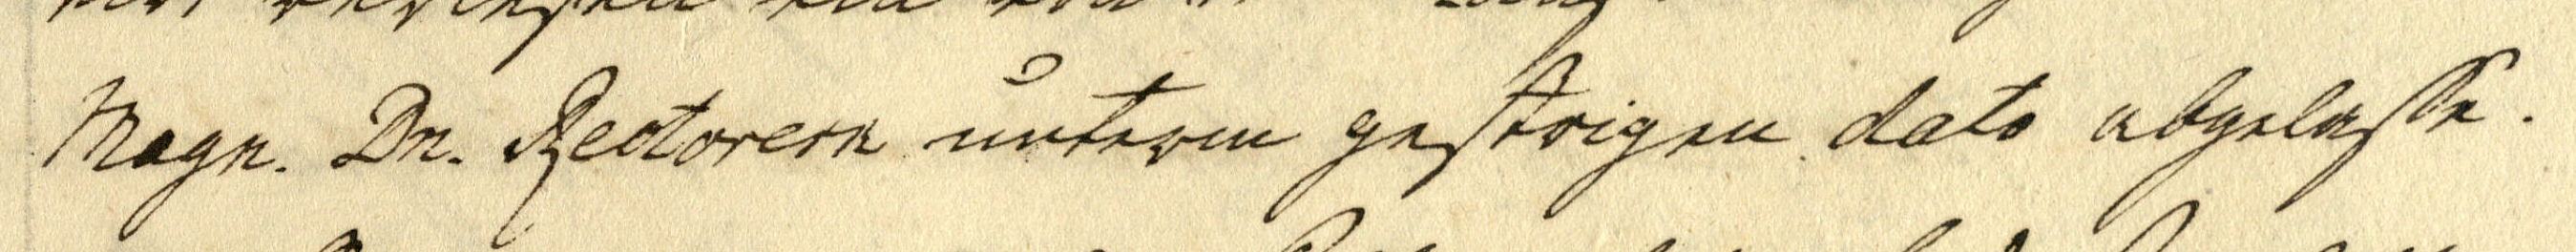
Magn. Dn. Rectorem unterm gestrigen dato abgelasse-
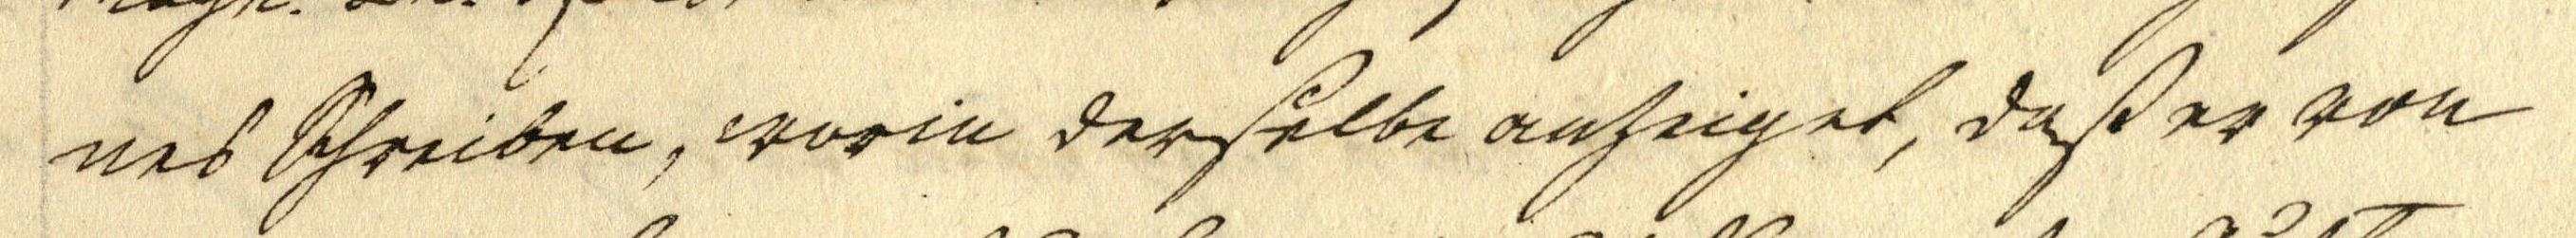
nes Schreiben, worin derselbe anzeiget, daß er von
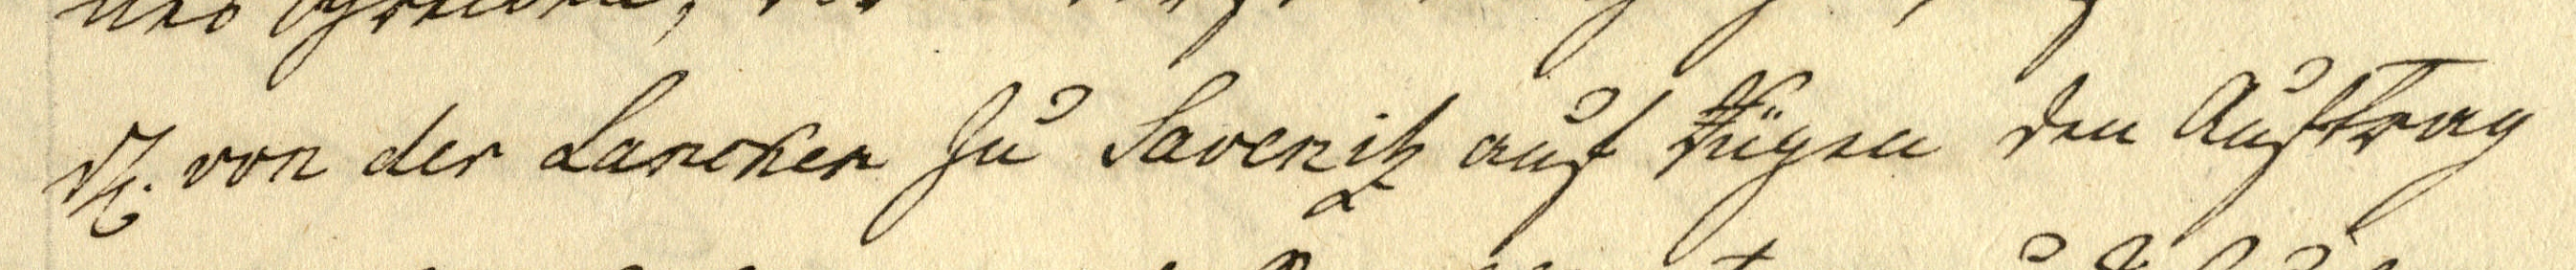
dh. von der Lancken zu Savenitz auf Rügen den Auftrag
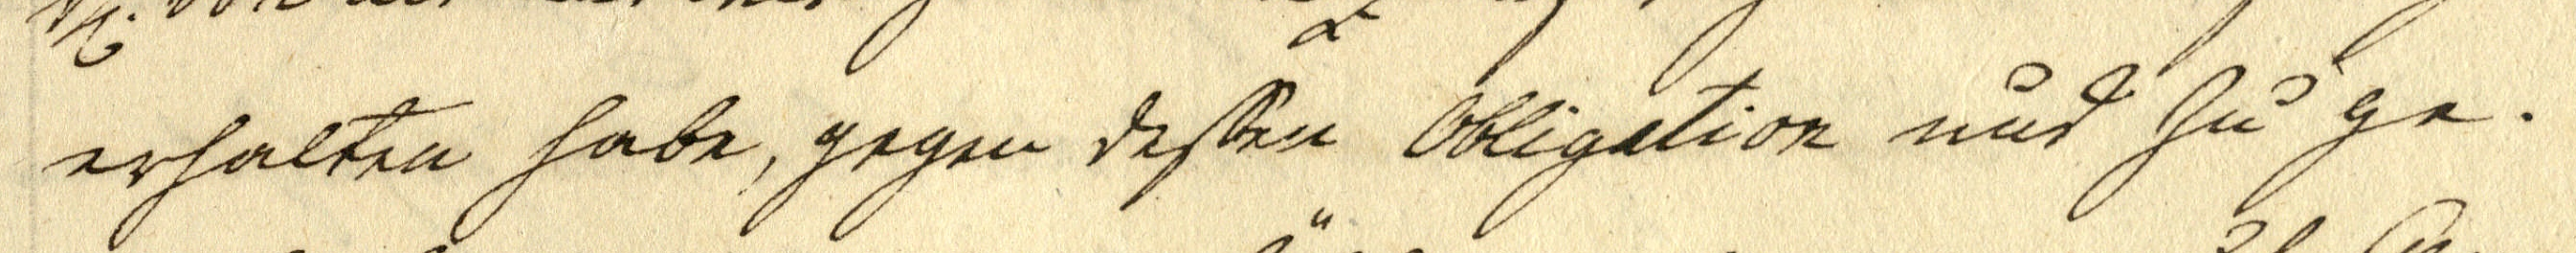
erhalten habe, gegen dessen Obligation und zu ge-
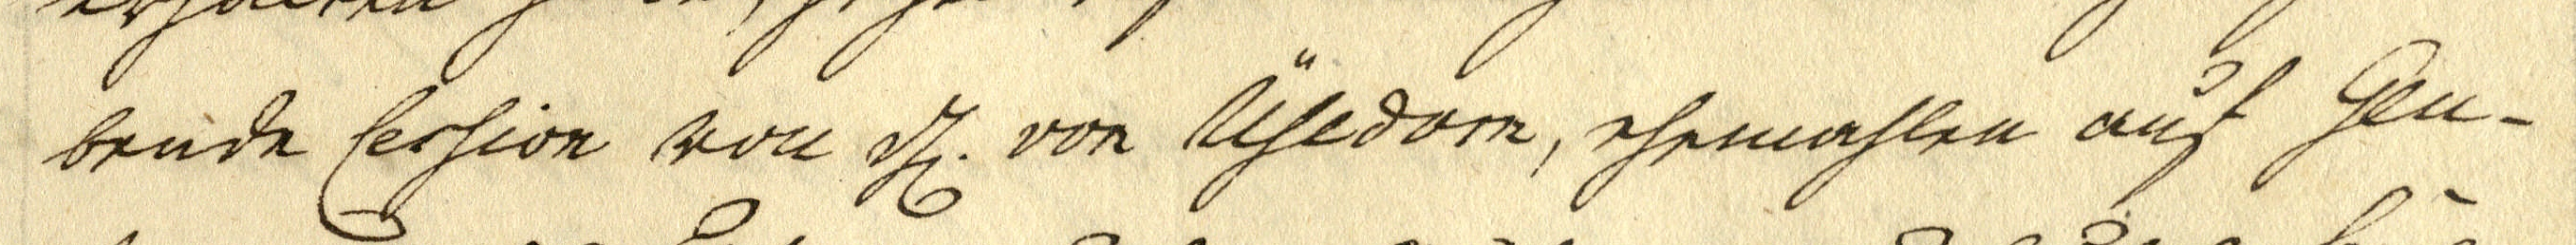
bende Cession von dh. von Usedom, ehemahlen auf Gen-
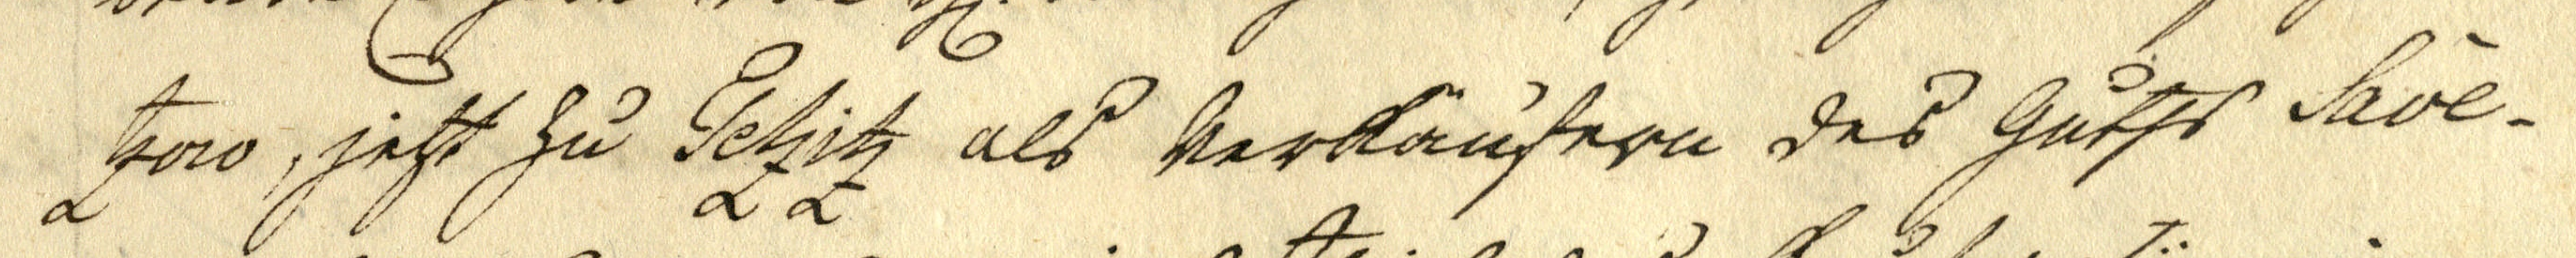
tzow, jetzt zu Tetzitz als Verkäufern des Guths Save-
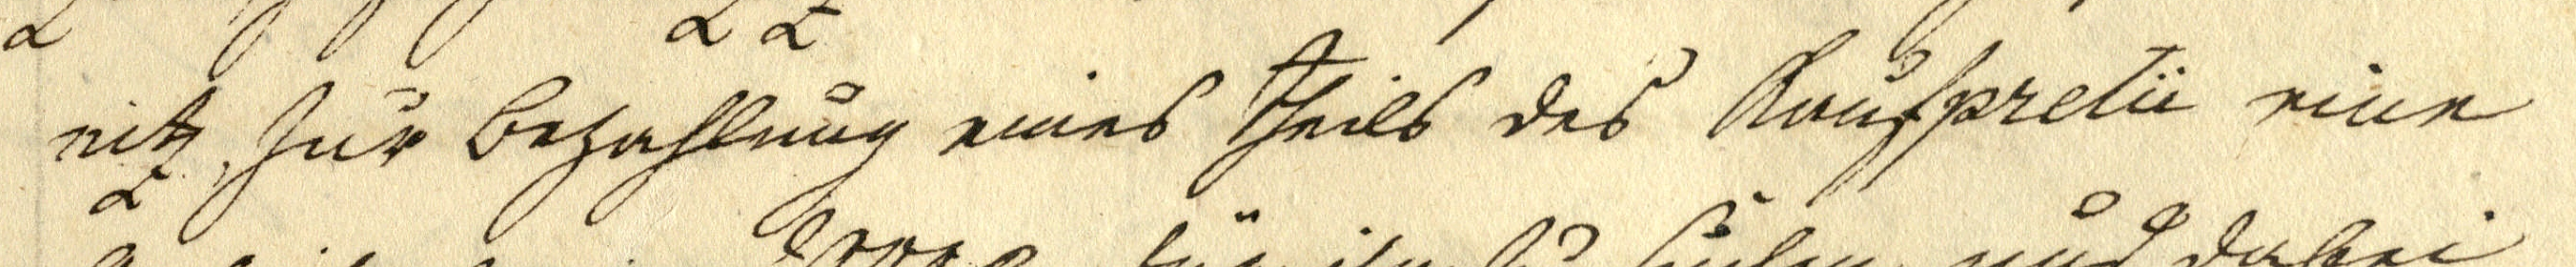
nitz zur Bezahlung eines Theils des Kaufpretii eine
